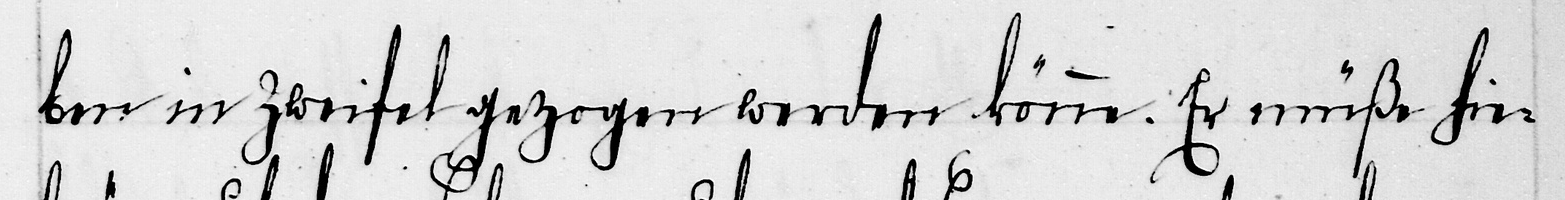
ben in Zweifel gezogen werden könne. Er müße hie¬
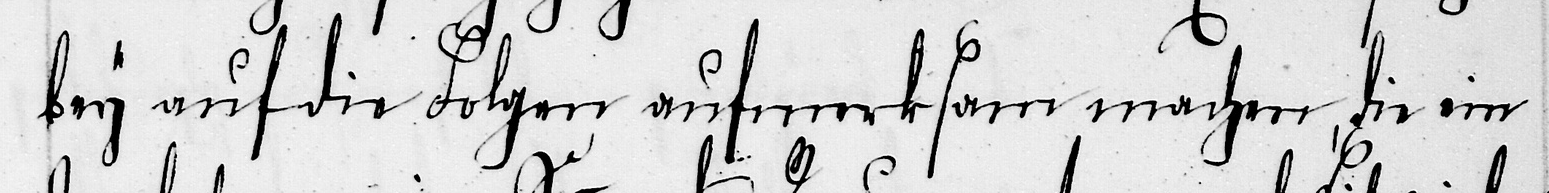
bey auf die Folgen aufmerksam machen, die ein
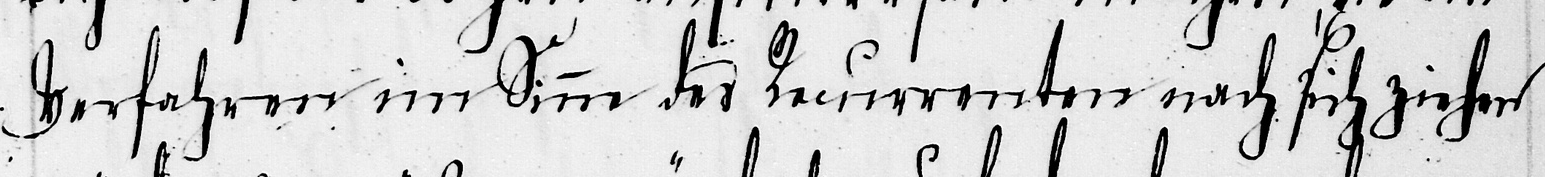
Verfahren im Sinne des Recurrenten nach sich ziehen
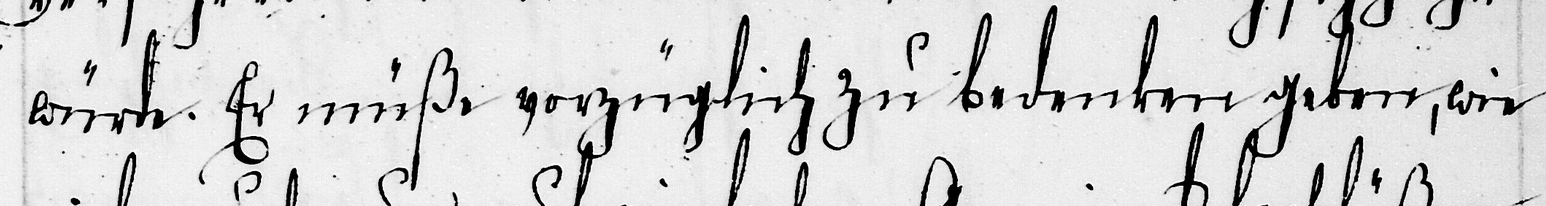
würde. Er müße vorzüglich zu bedenken geben, wie
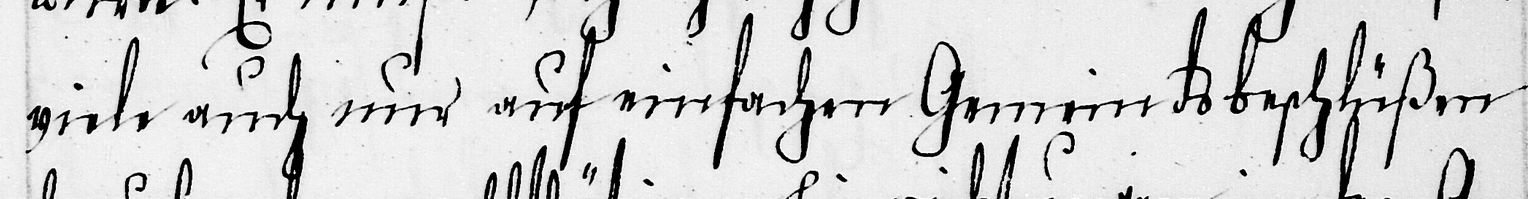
viele auch nur auf einfachen Gemeindsbeschlüßen
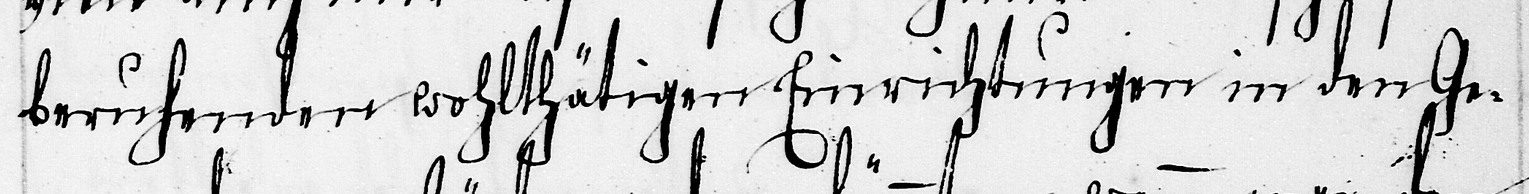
beruhenden wohlthätigen Einrichtungen in den Ge¬
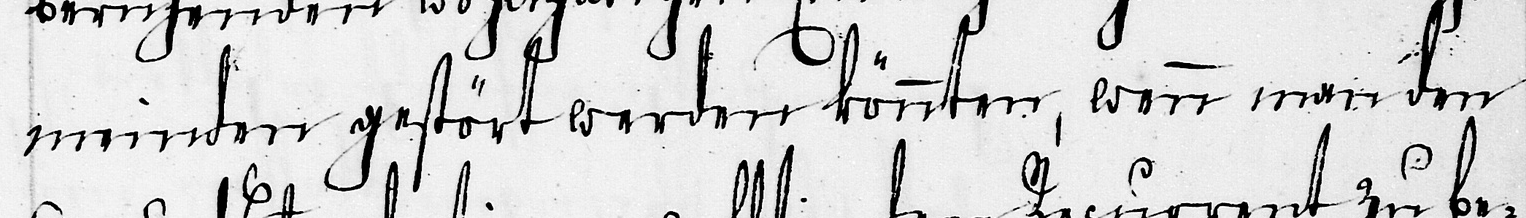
meinden gestört werden könnten, wenn man den
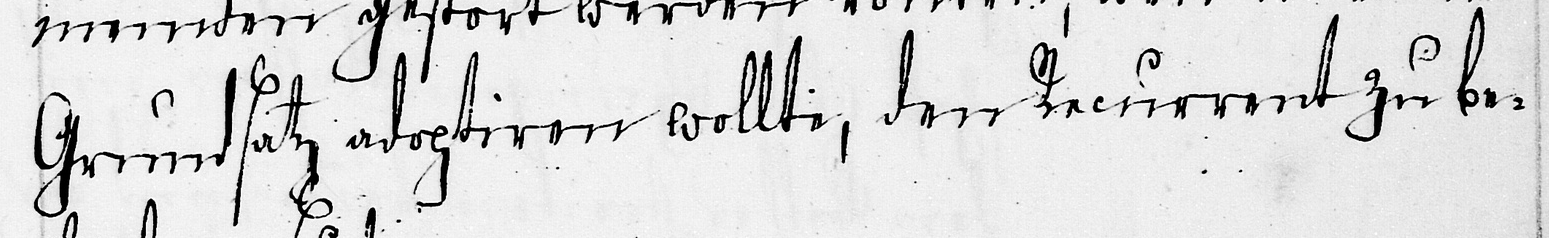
Grundsatz adoptiren wollte, den Recurrent zu be¬
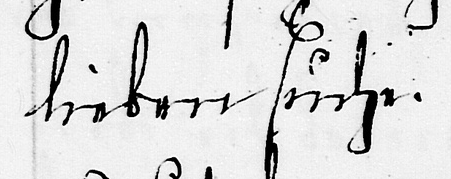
lieben suche.
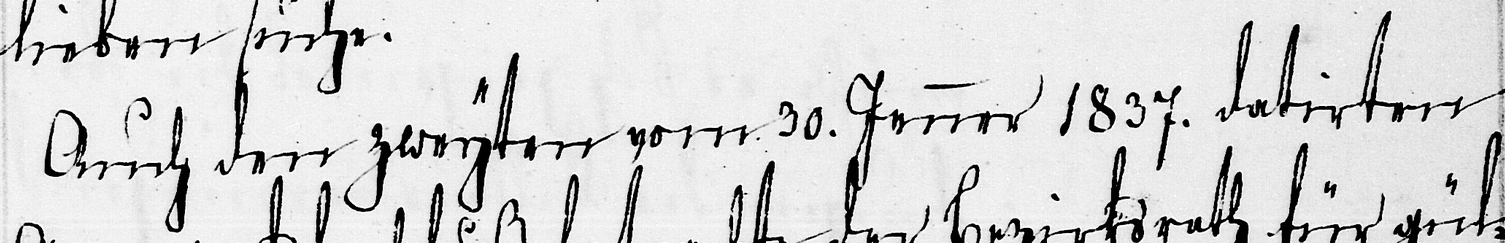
Auch den zweyten vom 30. Jenner 1837. datirten
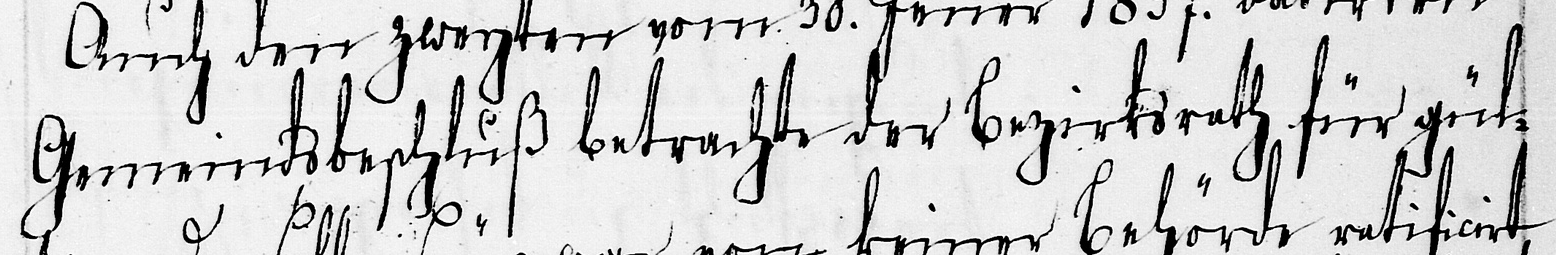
Gemeindsbeschluß betrachte der Bezirksrath für gül¬
